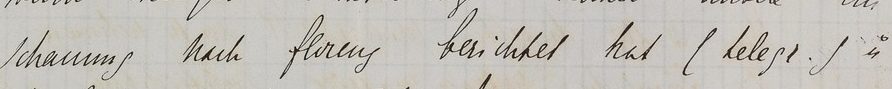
schauung nach Florenz berichtet hat (telegr.) u
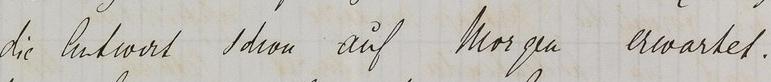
die Antwort schon auf morgen erwartet.
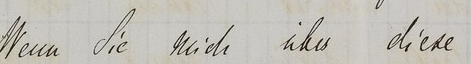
Wenn Sie mich über diese
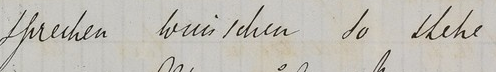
sprechen wünschen so stehe
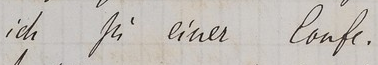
ich zu einer Confe-
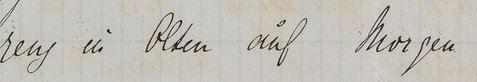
renz in Olten auf morgen
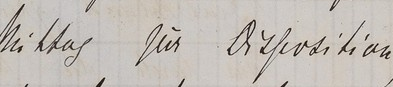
Mittag zur Disposition,
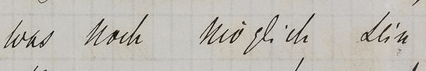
was noch möglich sein
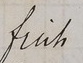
diesen
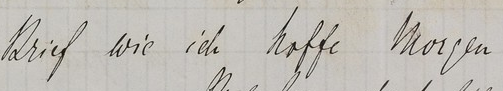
Brief wie ich hoffe morgen
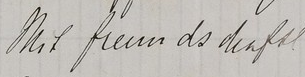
Mit freundschaftl.
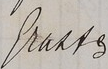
Grusse
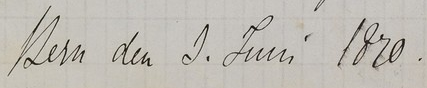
Bern den 3. Juni 1870.
